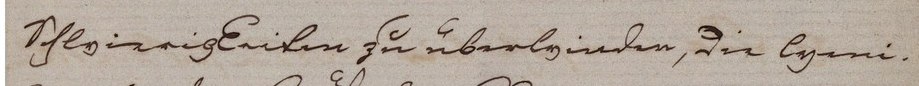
Schwierigkeiten zu überwinden, die weni-
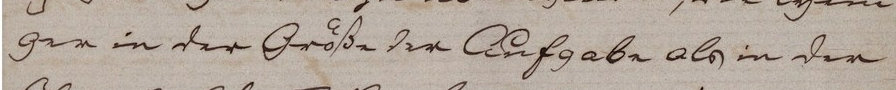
ger in der Größe der Aufgabe als in der
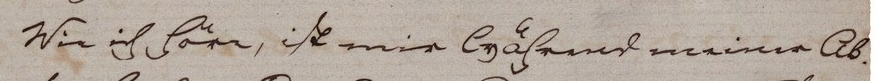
Wie ich höre, ist mir während meiner Ab-
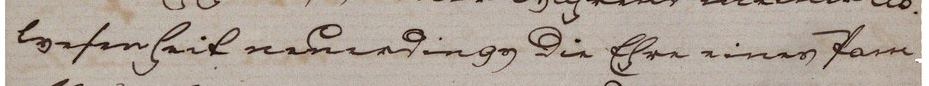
wesenheit neuerdings die Ehre eines Pam-
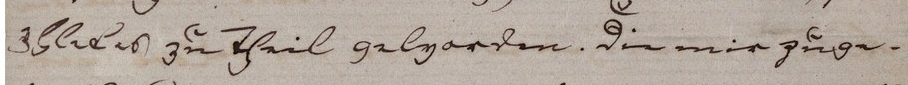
phletes zu Theil geworden. Die mir zuge-
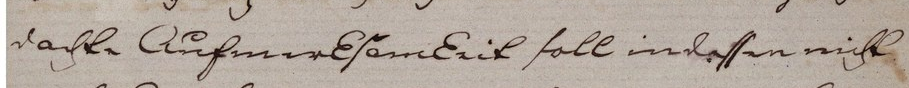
dachte Aufmerksamkeit soll indessen nicht
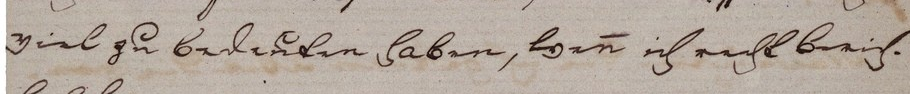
viel zu bedeuten haben, wenn ich recht berich-
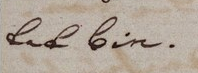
tet bin.
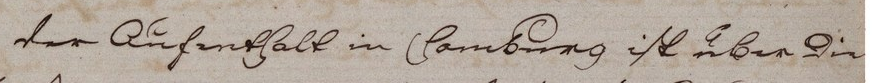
Der Aufenthalt in Homburg ist über die
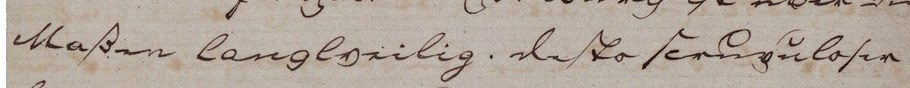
Maßen langweilig. Desto scrupuloser
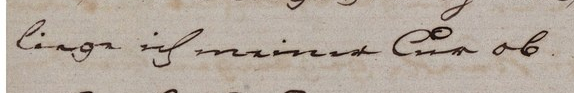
liege ich meiner Cur ob.
